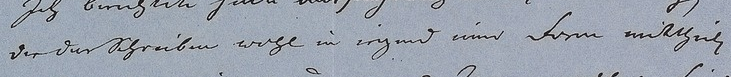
der das Schreiben wohl in irgend einer Form mittheilen
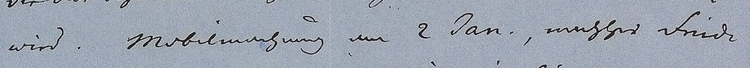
wird. Mobilmachung am 2 Jan., nachher Friede
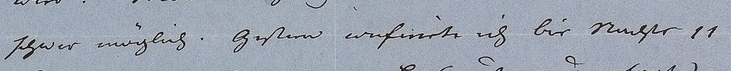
schwer möglich. Gestern conferirte ich bis Nachts 11
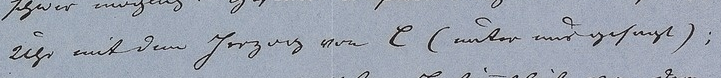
Uhr mit dem Herzog von C (unter uns gesagt);
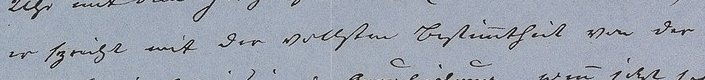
er spricht mit der vollsten Bestimmtheit von der
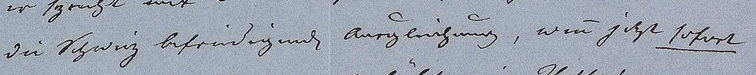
die Schweiz befriedigenden Ausgleichung, wenn jetzt sofort
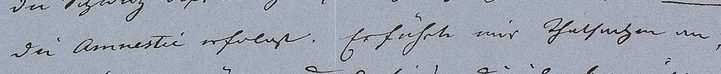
die Amnestie erfolgt. Er führte mir Thatsachen an,
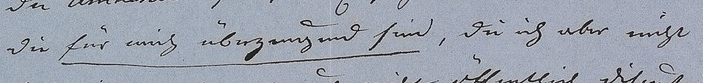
die für mich überzeugend sind, die ich aber nicht
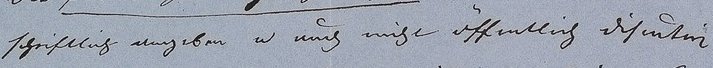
schriftlich angeben u auch nicht öffentlich discutiren
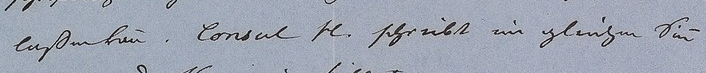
lassen kann. Consul H. schreibt im gleichen Sinn
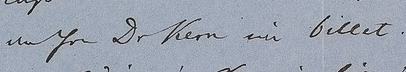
an Hrn Dr. Kern ein billet.
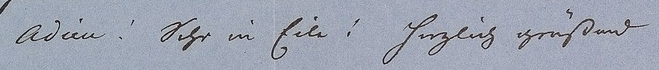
Adieu! Sehr in Eile! Herzlich grüßend
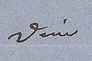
Dein
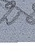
1856.
